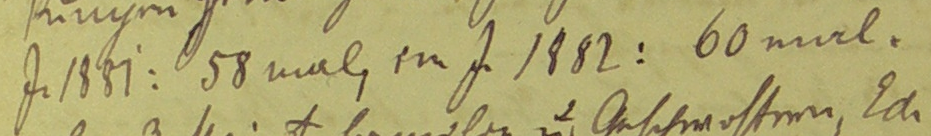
J. 1881: 58 mal, im J. 1882 : 60 mal.
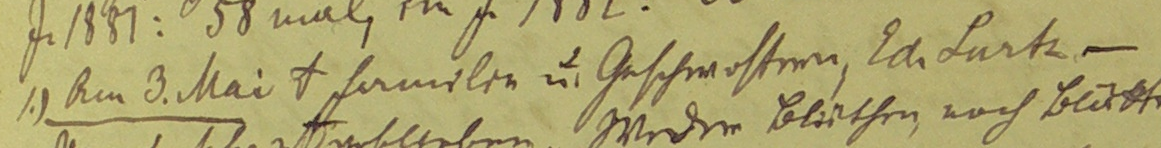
1) Am 3.Mai mit Familie und Geschwistern, Edi Lurtz.-
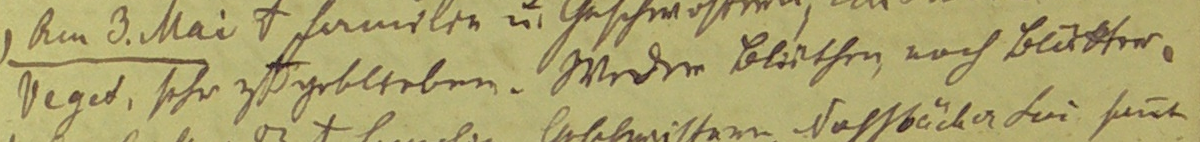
Vegetation sehr zurückgeblieben. Weder Blüthen noch Blätter.
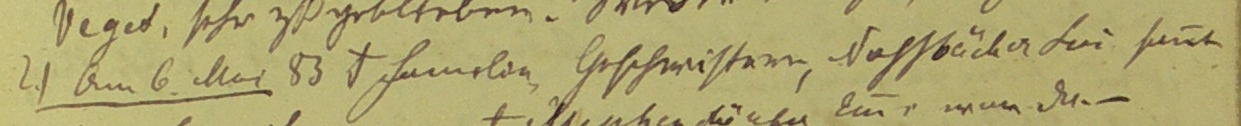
2) Am 6. Mai 83 mit Familie, Geschwister, Nussbächer Leni samt
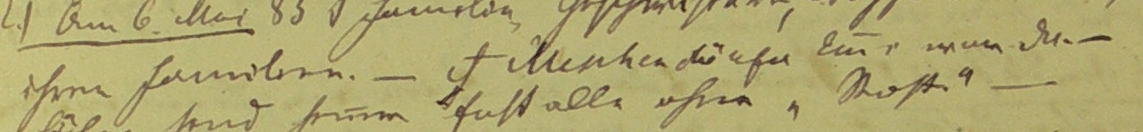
ihrer Familie.- mit Meschendörfer Emmi ?Wenn ? Diese
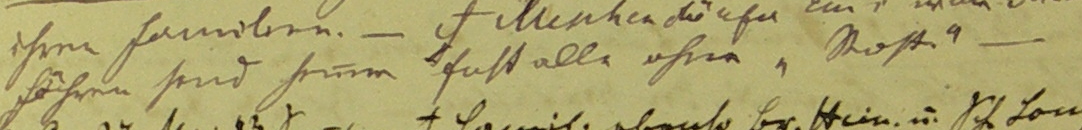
Föhren sind heuer fast alle ohne „Rost“—
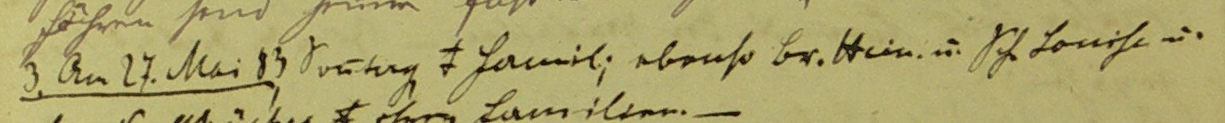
3) Am 27 mai 83. Sonntag mit Familie; ebenso Br. Heinrich und Schw. Louise und
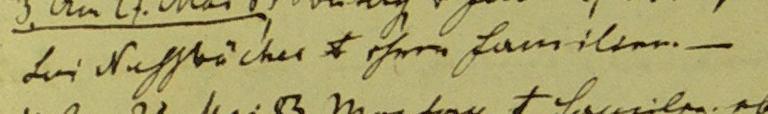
Loi Nussbächer mit ihren Familien.-
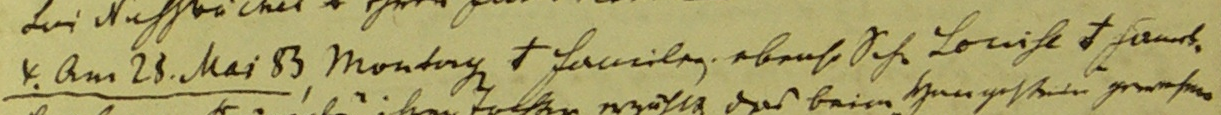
4) Am 23 Mai 83. Montag mit Familien, ebenso Schw. Louise mit Familie.
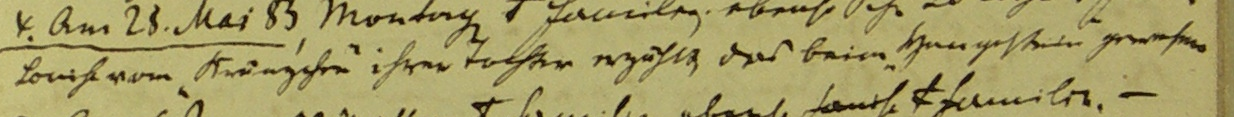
Louise vom „Kränzchen“ ihrer Tochter erzählt das beim „Hangestein „ gewesen.—
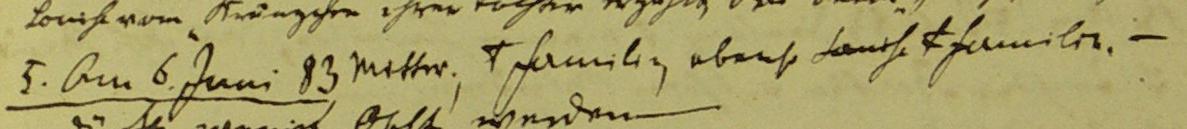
5) Am 6.Juni 83. Mttwoch: mit Familie, ebenso Louise mit Familie,
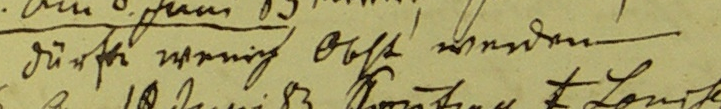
dürfte wenig Obst werden.
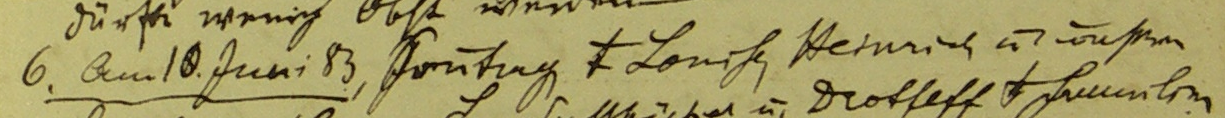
6) Am 10. Juni. 83. Sonntag. Mit Louise, Heinrich und unseren
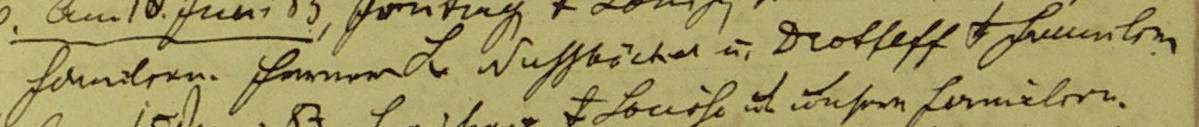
Familien. Ferner L. Nussbächer und Drotleff mit Familien.
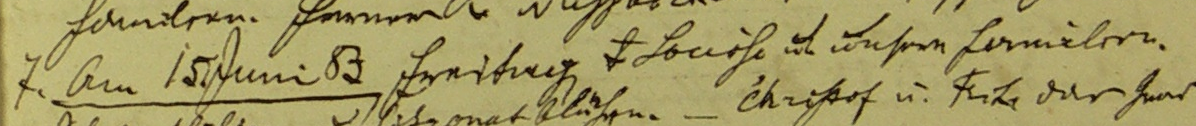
7) Am 15. Juni 83. Freitag mit Louise und unseren Familien.
